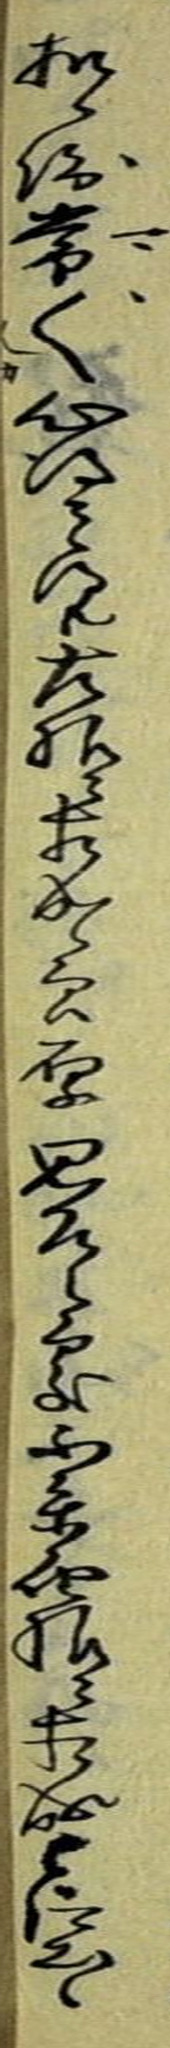控候儀常〳〵心得ニ候得共左様ニ相成候而ハ厚思召候処不参届様ニ相成被仰出候
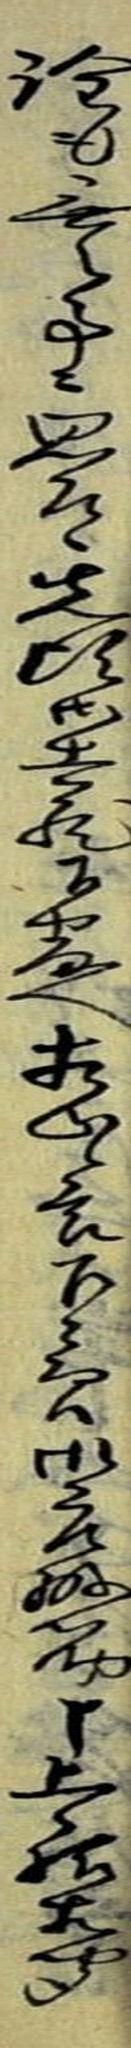詮も無之事ニ思召候先頃御土蔵下番人相止候節下ニ而ハ御取扱筋申上候様相聞
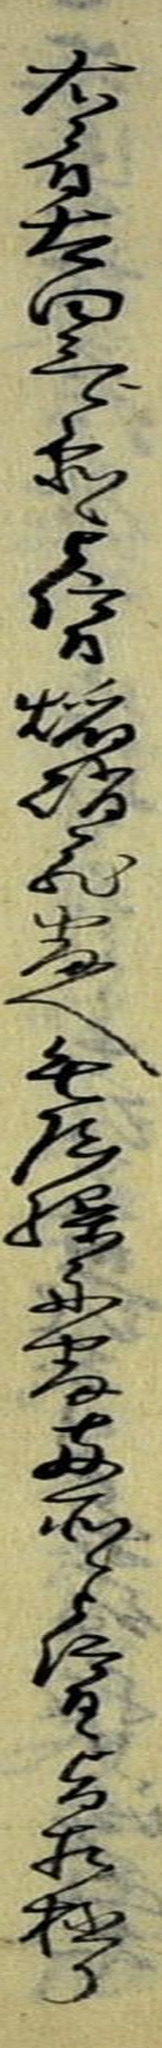右ニ付太田三郎兵衛へ被仰付焔硝蔵番人毛屋繰舟番両所へ被仰付候旨相極り
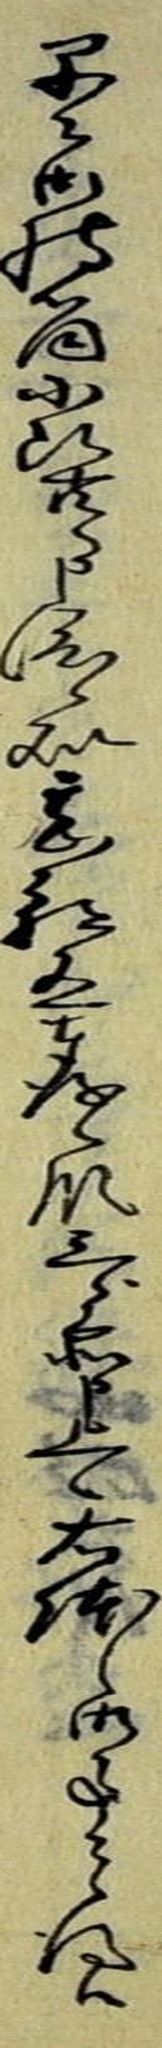早々御持筒小頭共へ申渡候処甚難有奉存候段三郎兵衛申上候右体之御事ニ候得ハ
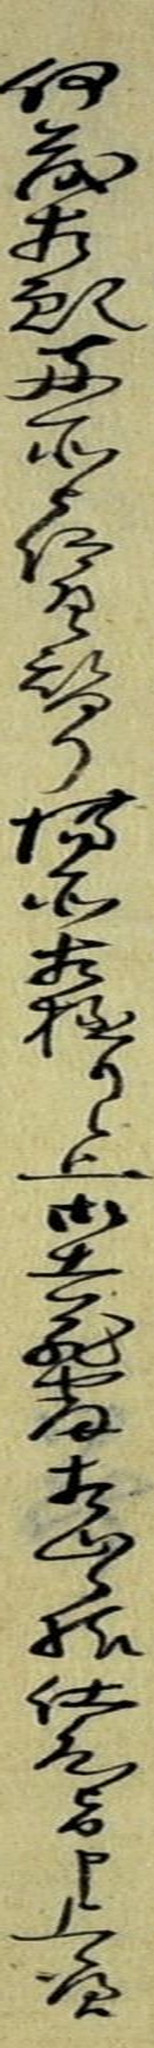何茂相願両所被仰付候替り場所相極り候上御土蔵番相止候様仕度旨申上候得ハ
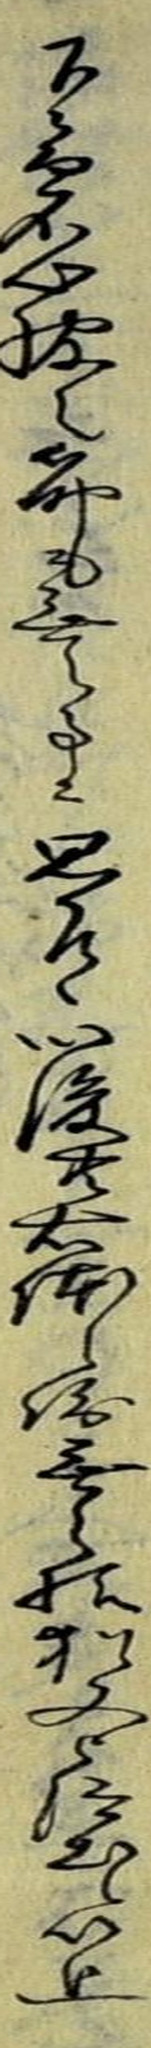下ニ而不心服之筋も無之事ニ思召候以後共右体之儀無之様猶又被仰出候以上
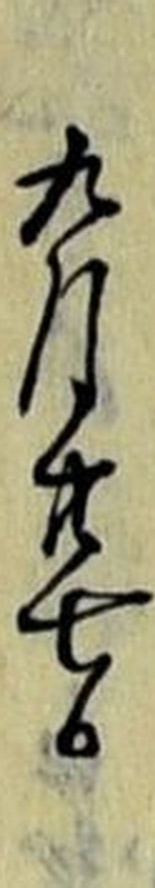九月廿七日
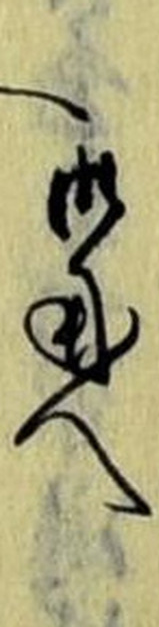御用人
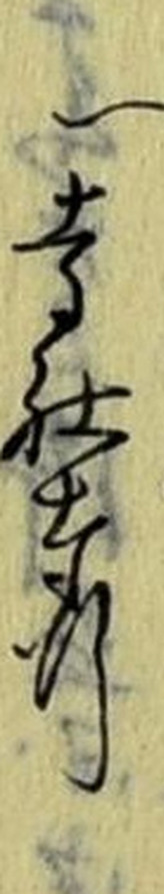寺社奉行
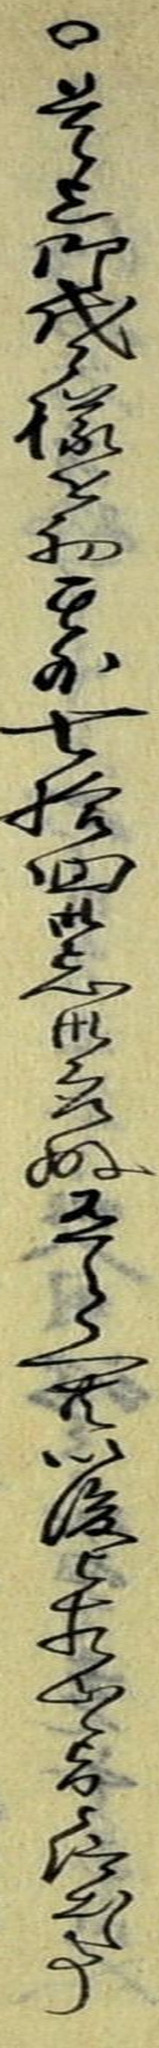〇是迄御代々様を初其外七拾回御忌御取扱有之候へ共以後被相止候旨被仰出候事
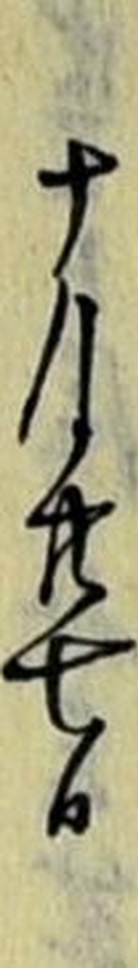十月廿七日

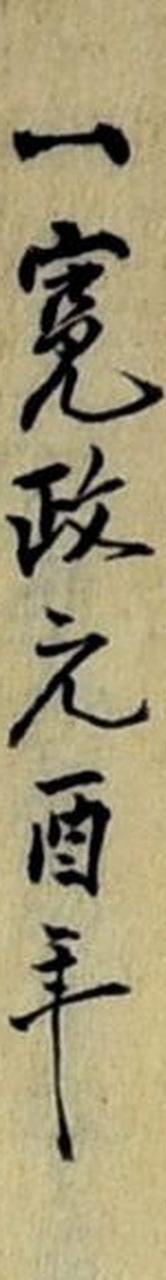一寛政元酉年
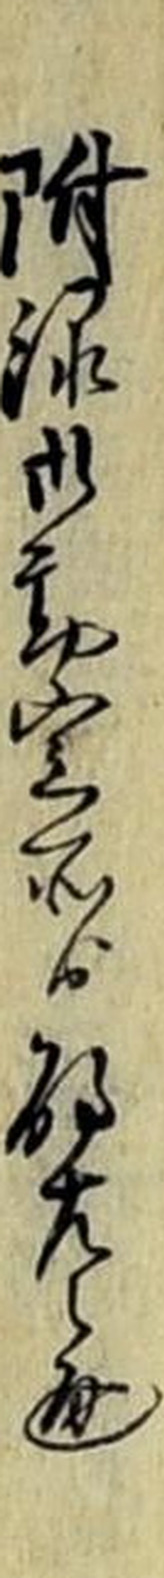附録御勘定所ゟ触左之通
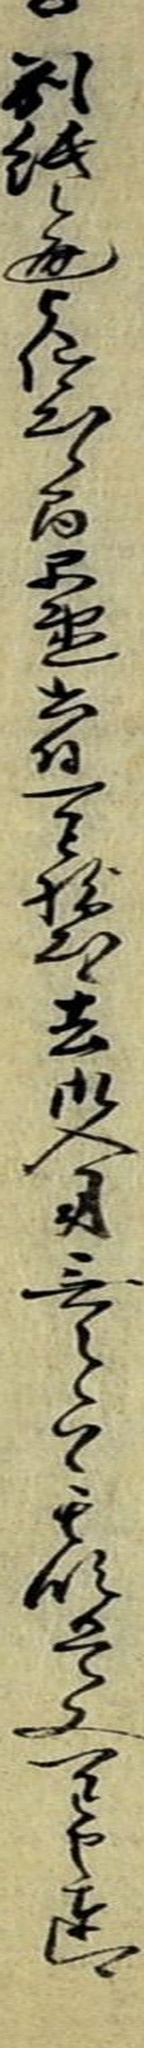〇別紙之通被仰出候間早速書付可被指出候去御入用無之候ハヽ其段是又可被申達候
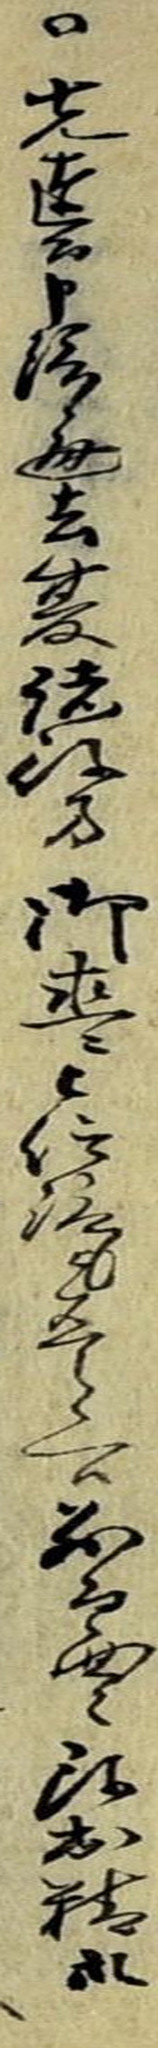〇先達而申渡候通去夏諸役方御直ニ被仰渡も有之候へハ別而面々致出精御
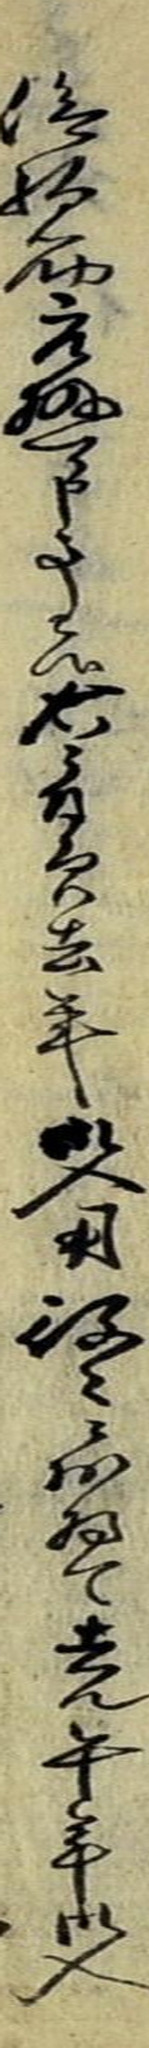倹約筋取扱可申事ニ候右ニ付而ハ去年御入用役々ニおゐて去ル午年御入
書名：命令之部 三
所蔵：福井県文書館 Fukui Prefectural Archives
